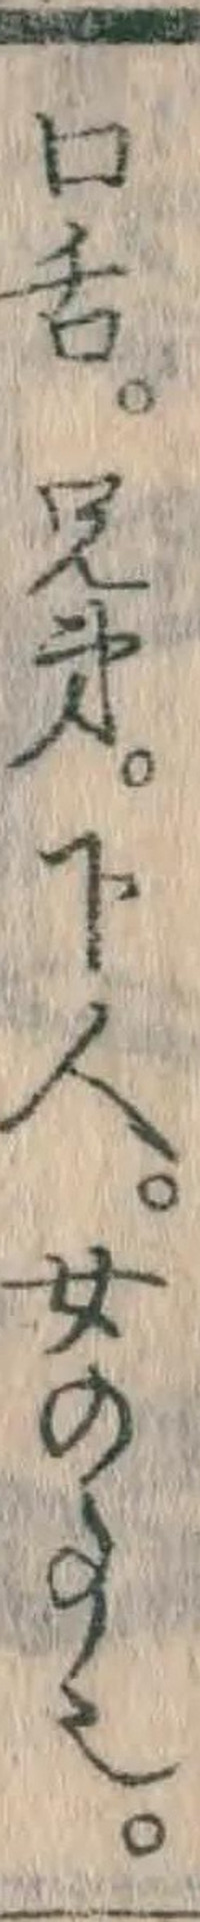口舌。兄弟。下人。女の事也。
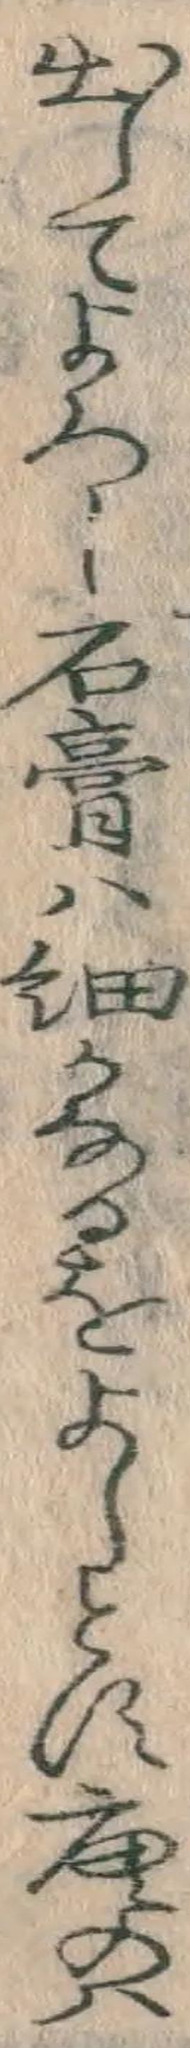出してよろし石膏は細かなるをよしとす唐のは
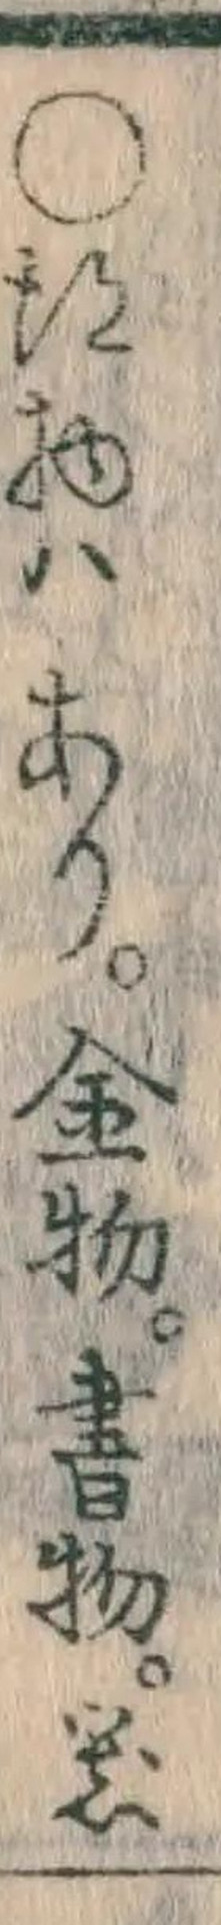○得物はあり。金物。書物。器
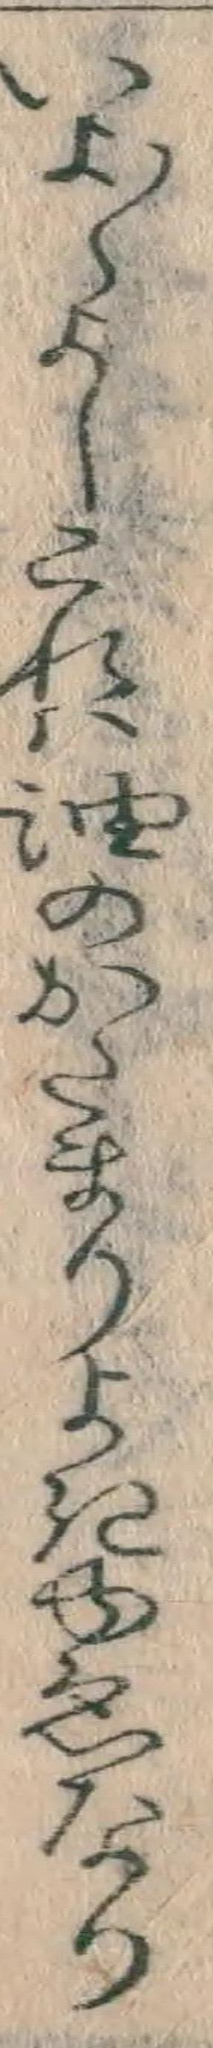いよ〳〵よしこれは油のかたまりよきゆゑなり
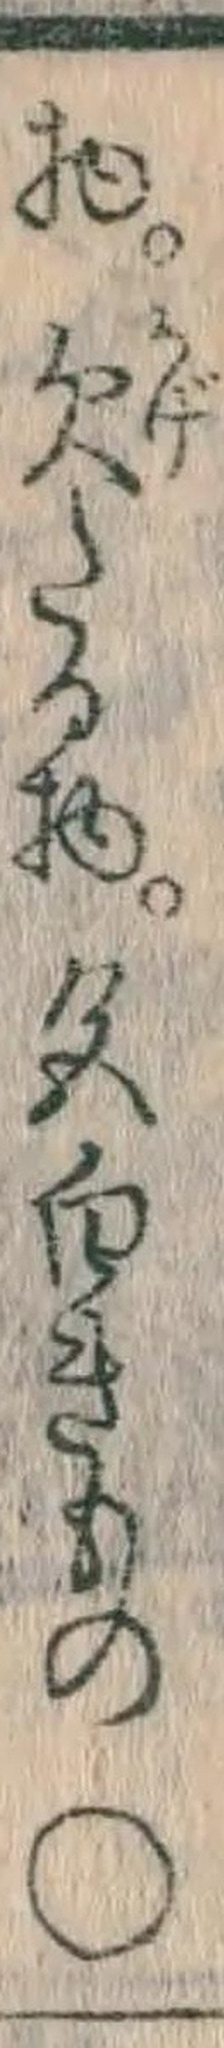物。欠たる物。色白きもの○
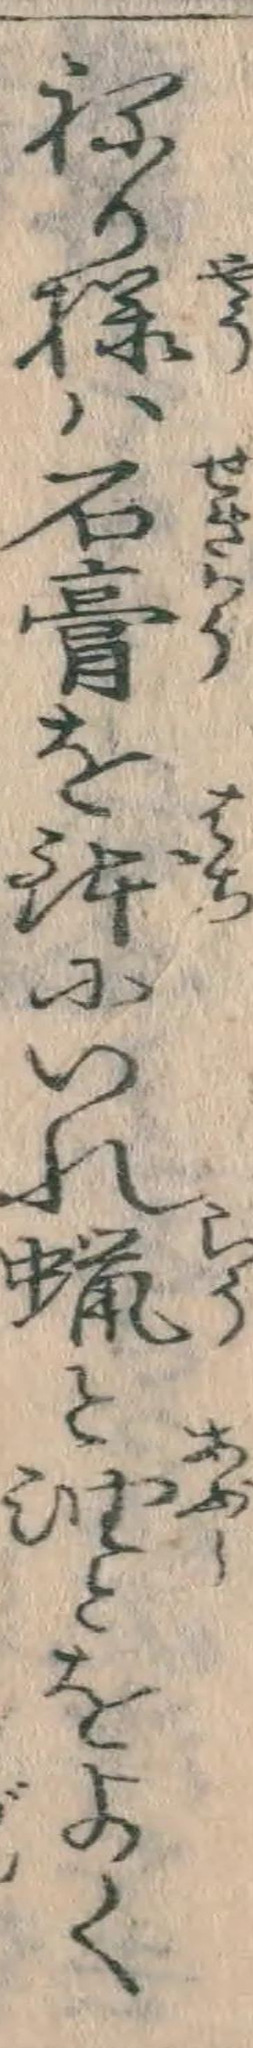ねり様は石膏を鉢にいれ蠟と油とをよく
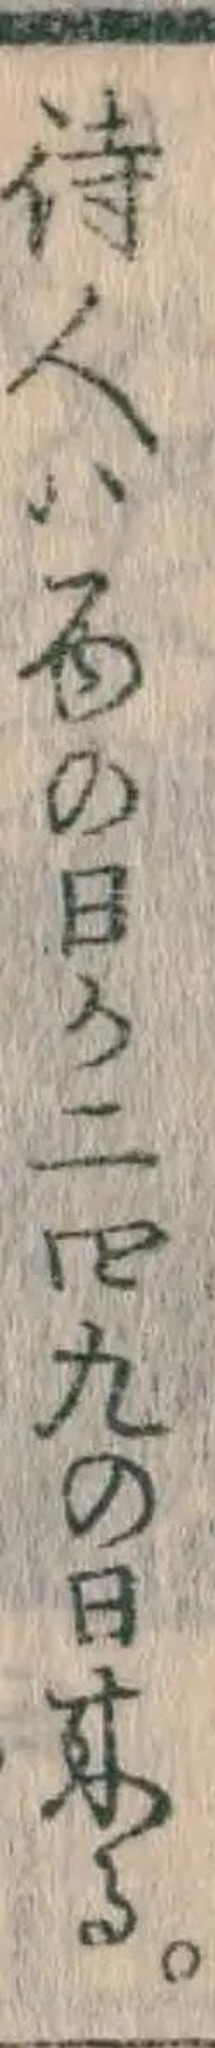待人は酉の日か二四九の日来る。
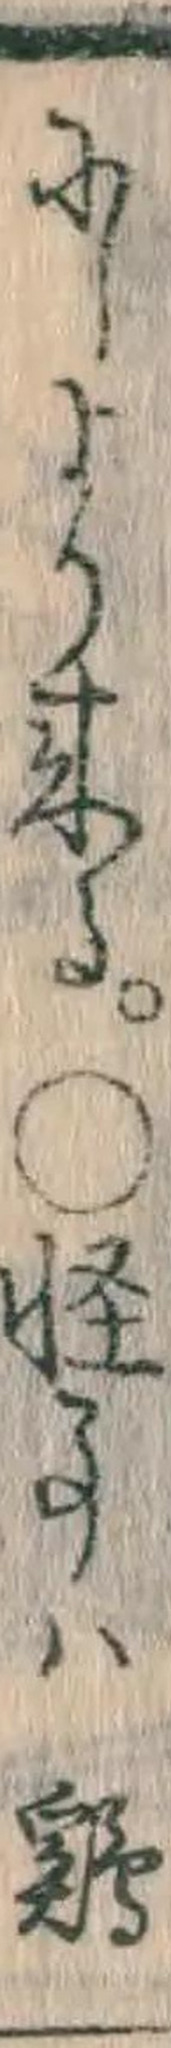にしより来る。○怪事は鶏
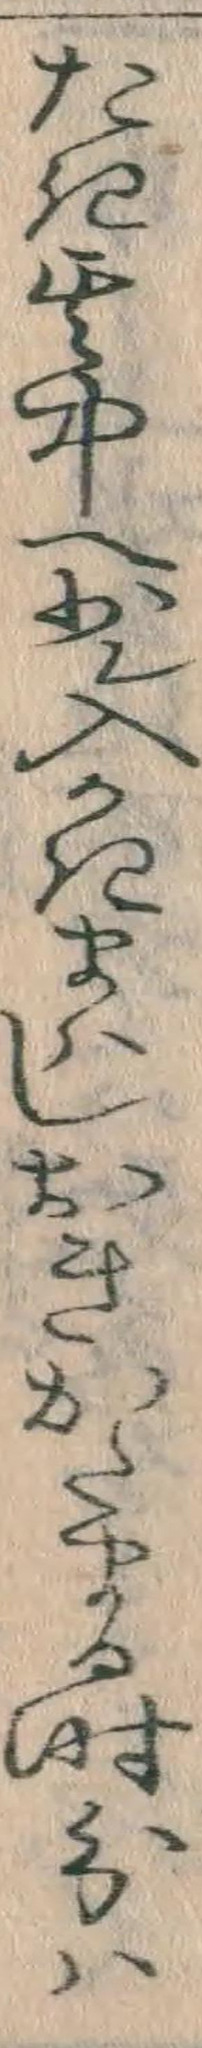たき其中へ少し入かきまはしおきかたまる時分は
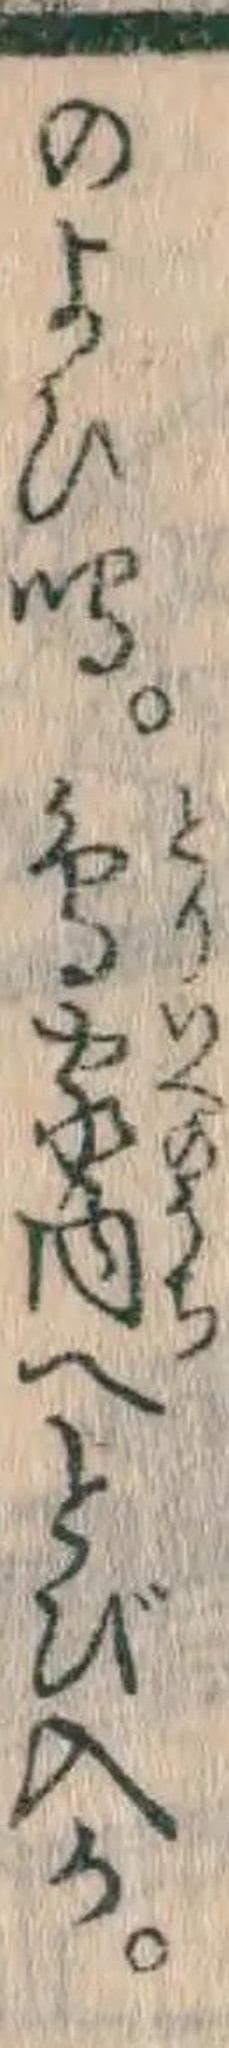のよひ鳴。鳥家内へとび入か。
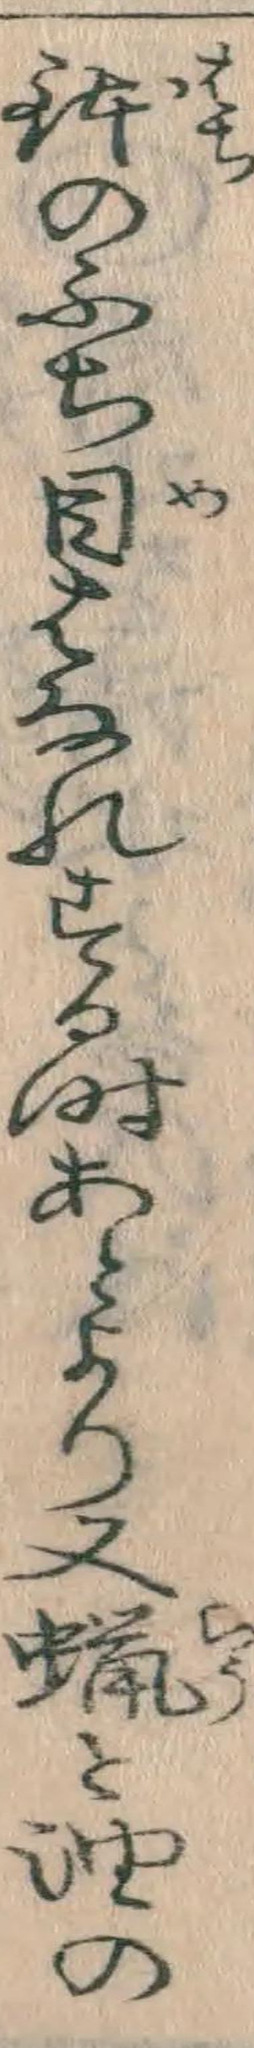鉢のふち目はなれする時あとより又蠟と油の
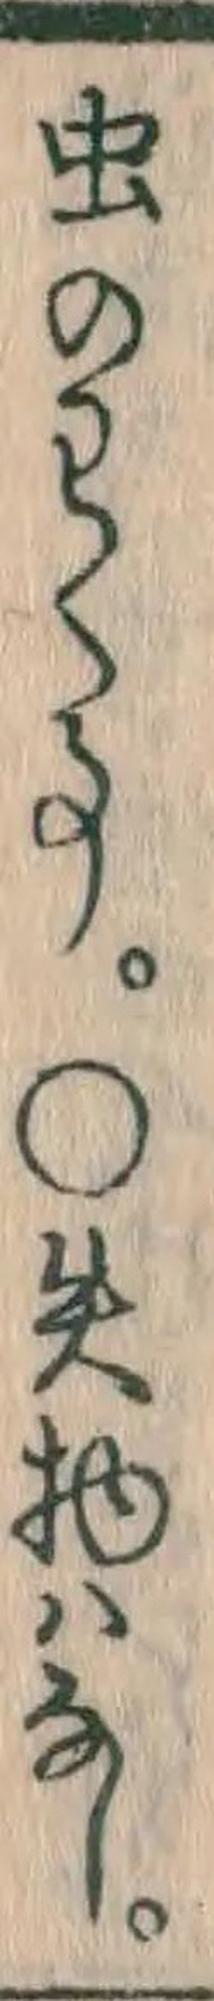虫のわく事。○失物はなし。
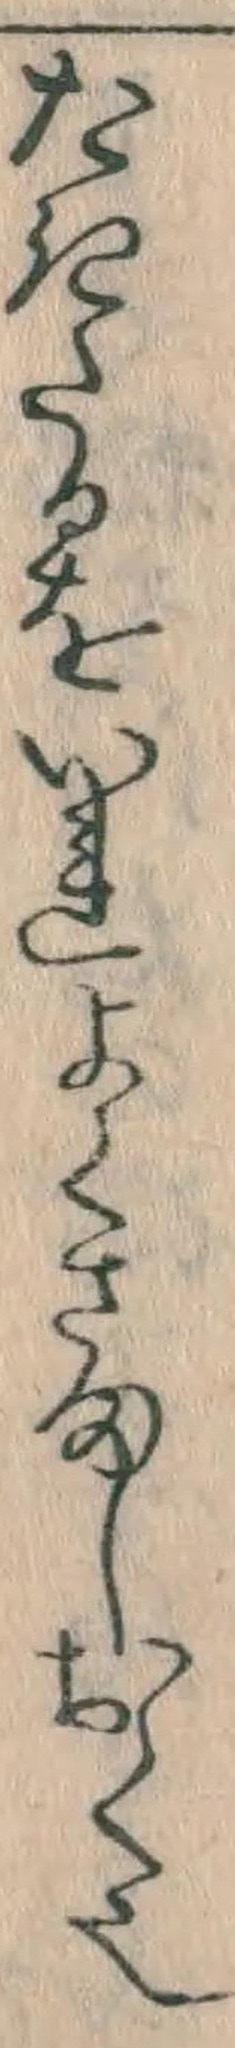たきたるをいれよくさましおく也
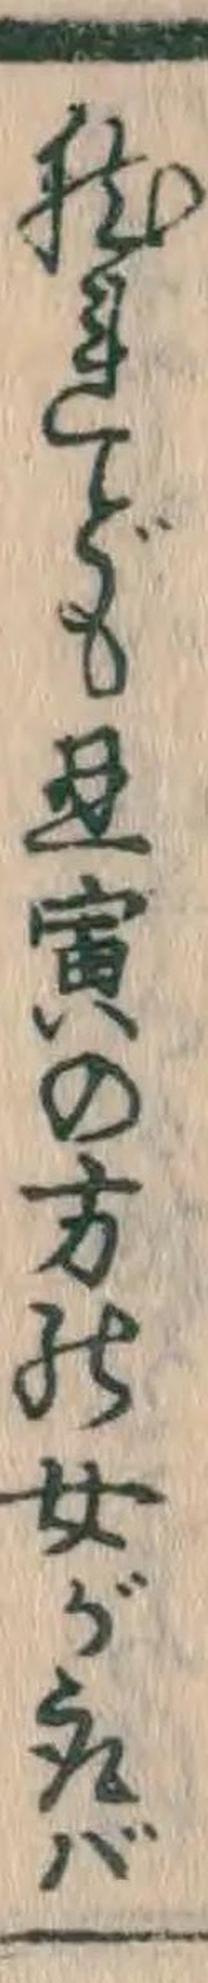然れども丑寅の方の女が取ば
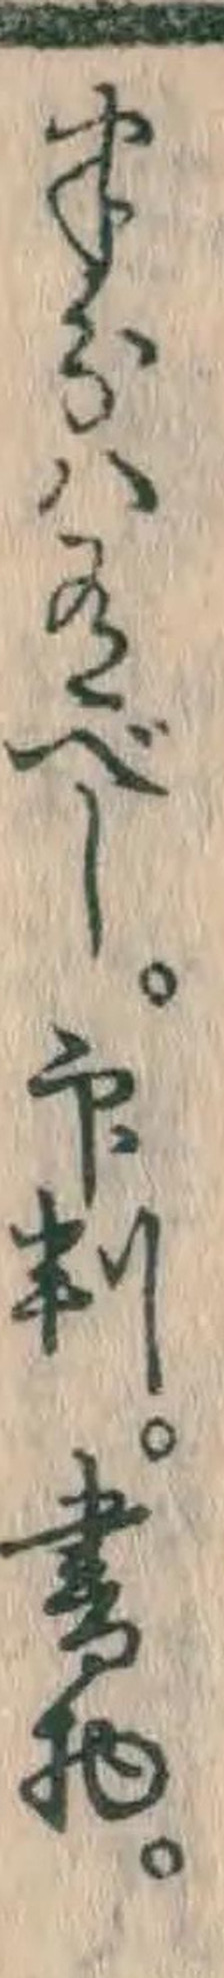半分は有べし。印判。書物。
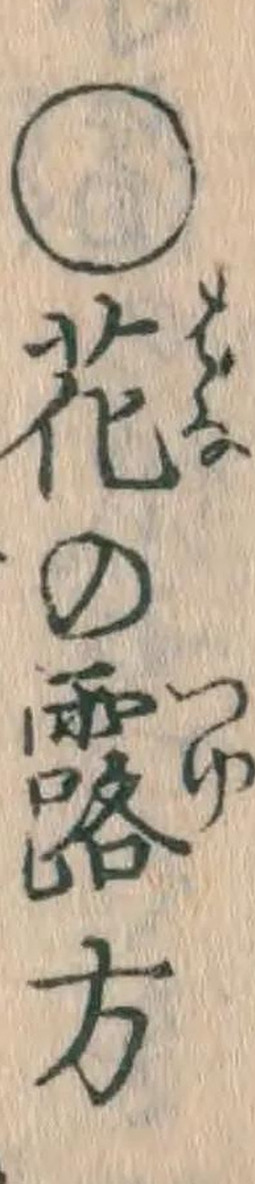○花の露方
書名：広益秘事大全 3巻. [1]
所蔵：国立国会図書館 National Diet Library, JAPAN
